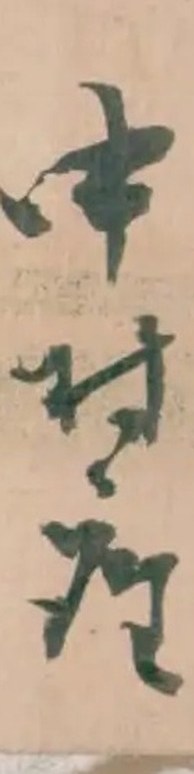中村座
